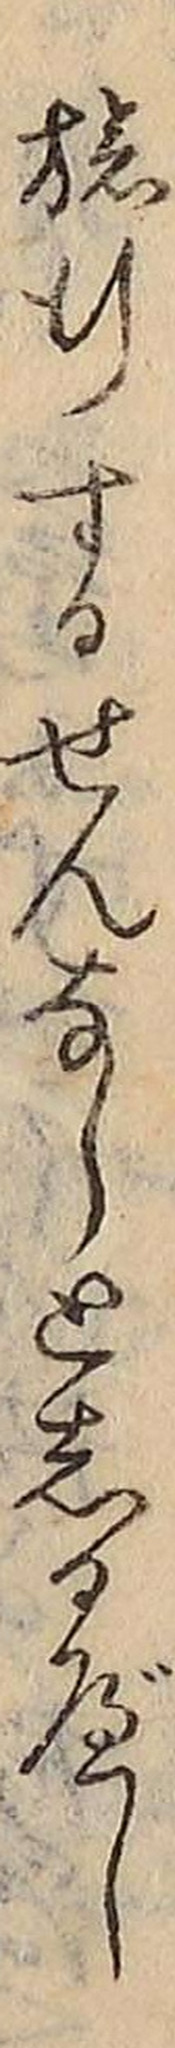旅行するせんなしとしるべし
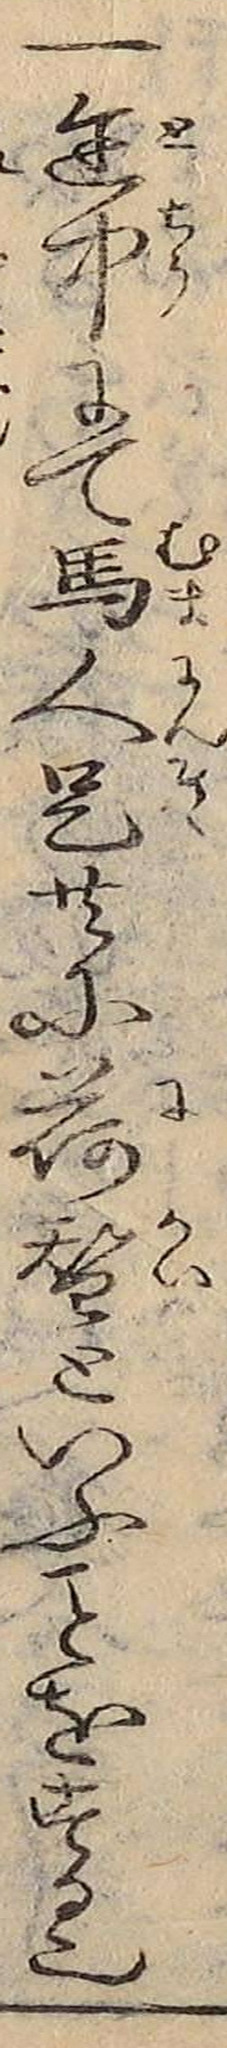一途中にて馬人足共に荷替といふことをする也
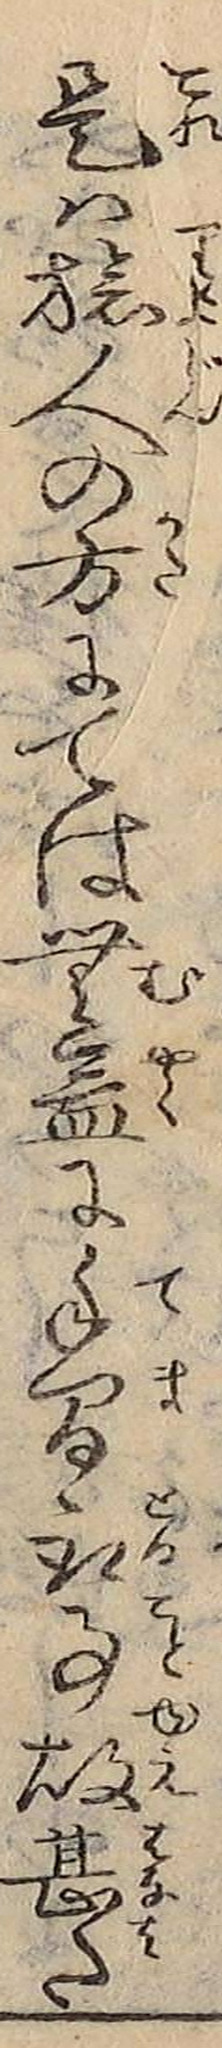是は旅人の方にては無益に手間取事故甚た
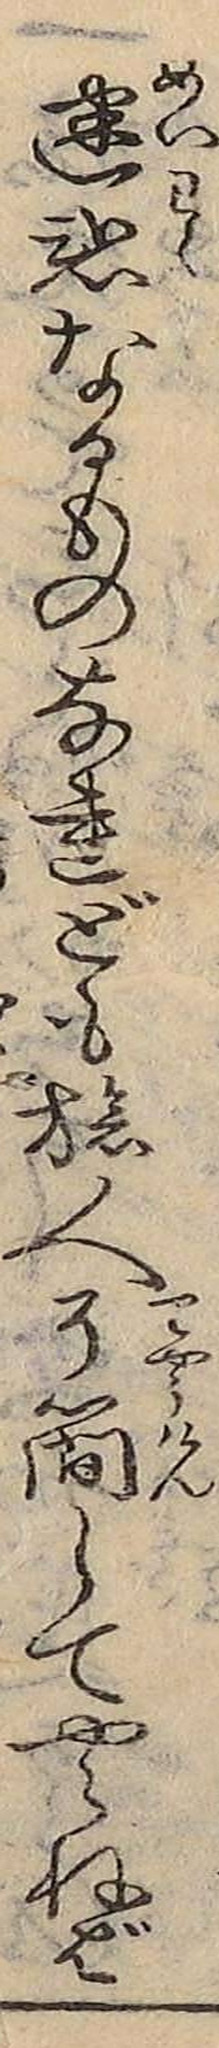迷惑なるものなれども旅人了簡してやらねば
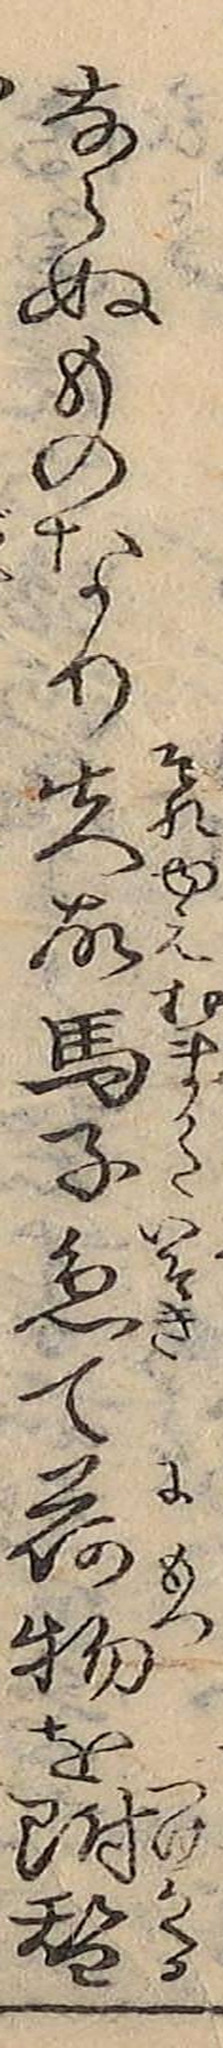ならぬものなり先故馬子急て荷物を附替
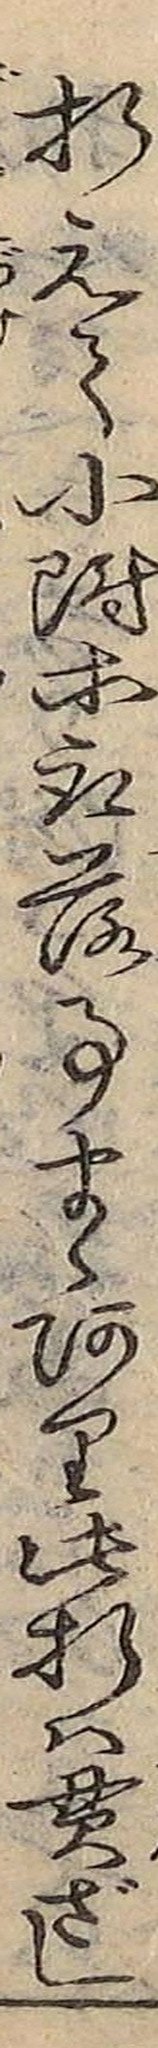折えて小附等取落事まゝあり此折は貫ざし
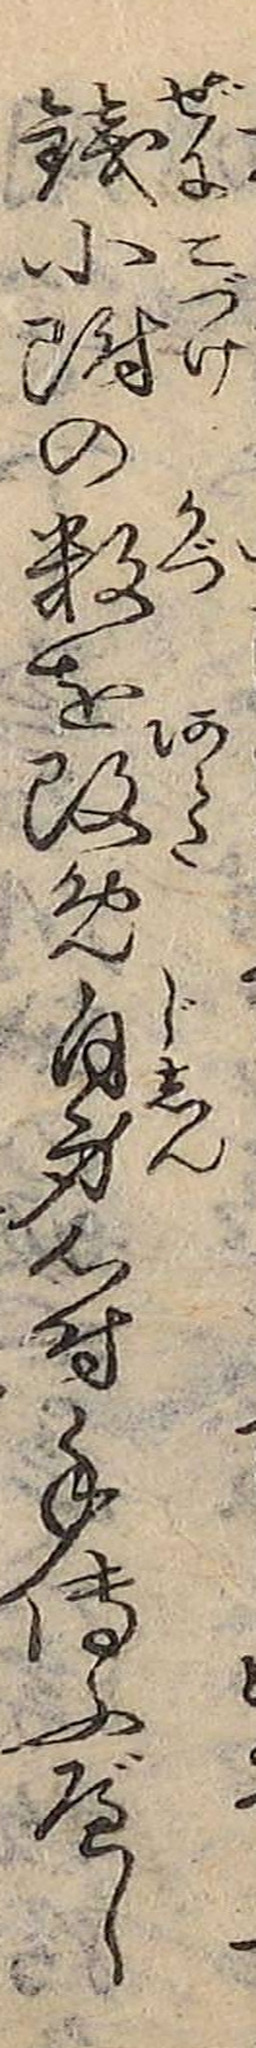銭小附の数を改め自身心付手伝ふべし
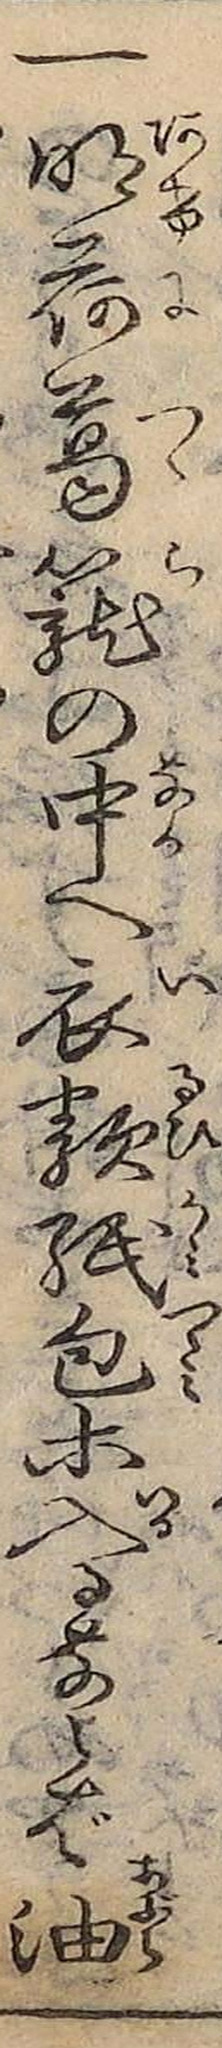一明荷葛籠の中へ衣類紙包等入るならば油
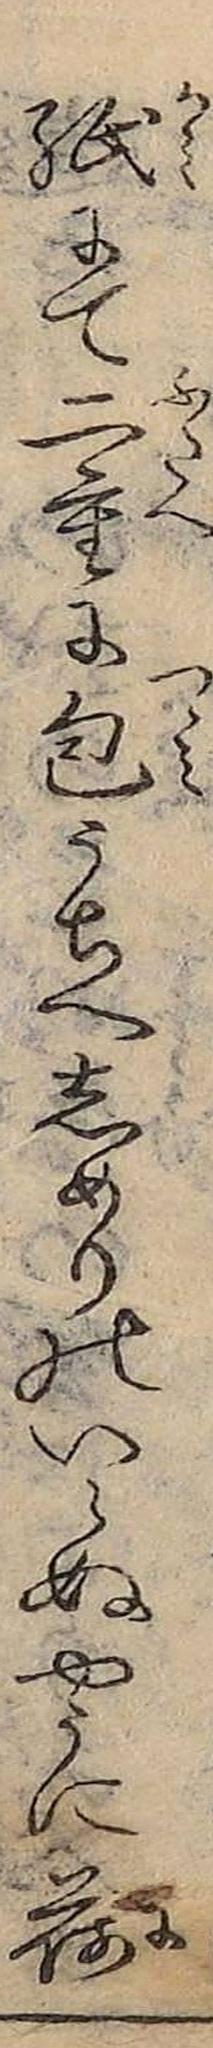紙にて二重に包うちへしめりのいらぬやうに荷

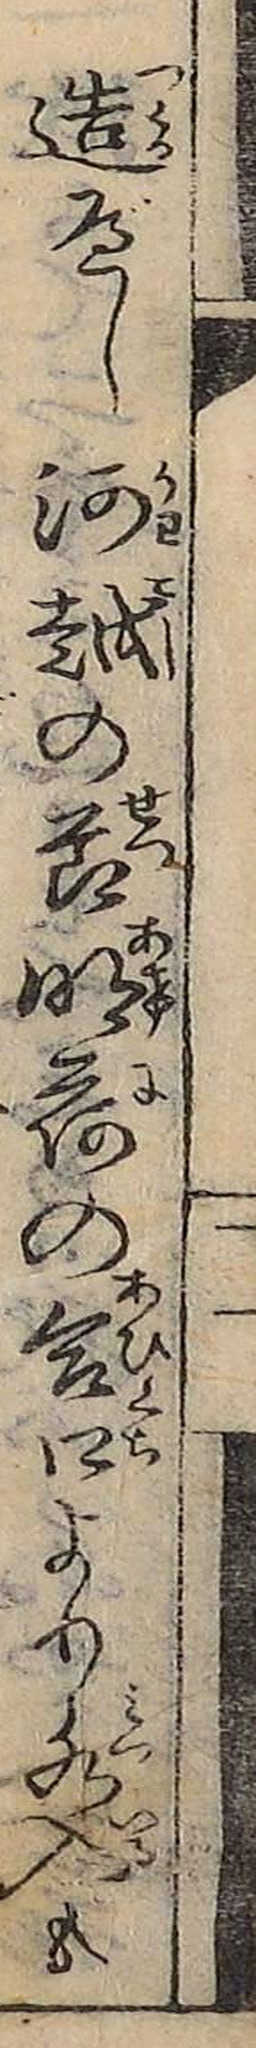造べし河越の節明荷の合口より水入も
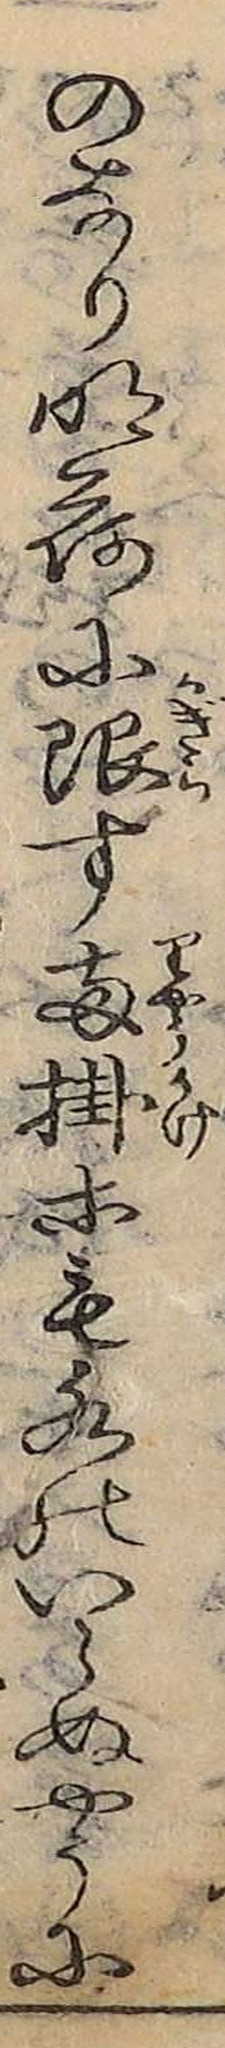のなり明荷に限す両掛等も水のいらぬやうに
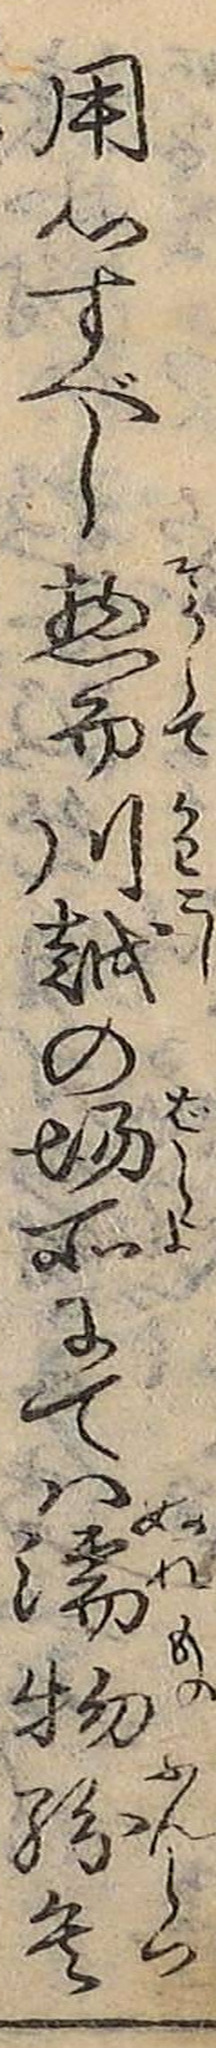用心すべし惣而川越の場所にては濡物紛失
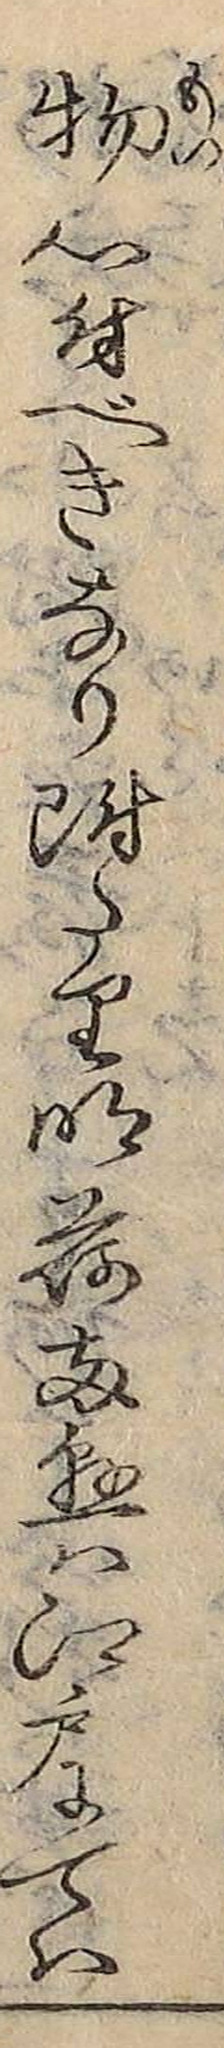物心付べきなり附たり明荷両懸は江戸にては
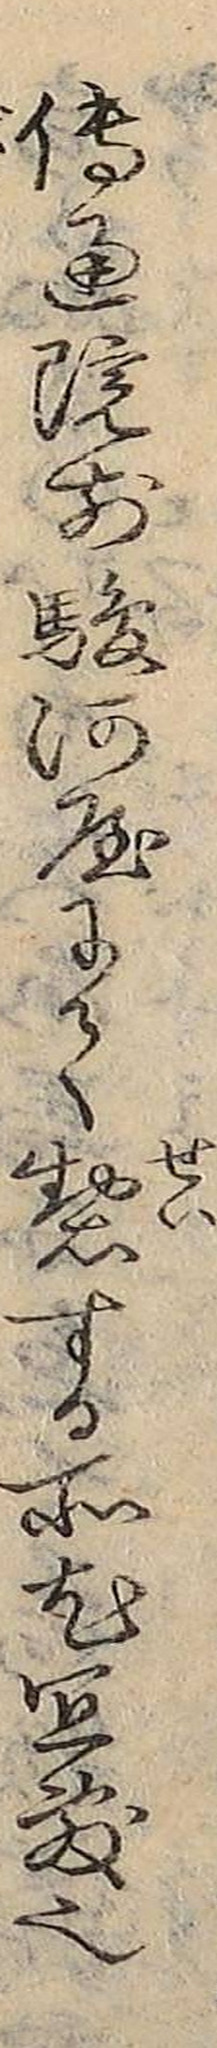伝通院前駿河屋にて製する所尤宜敷也
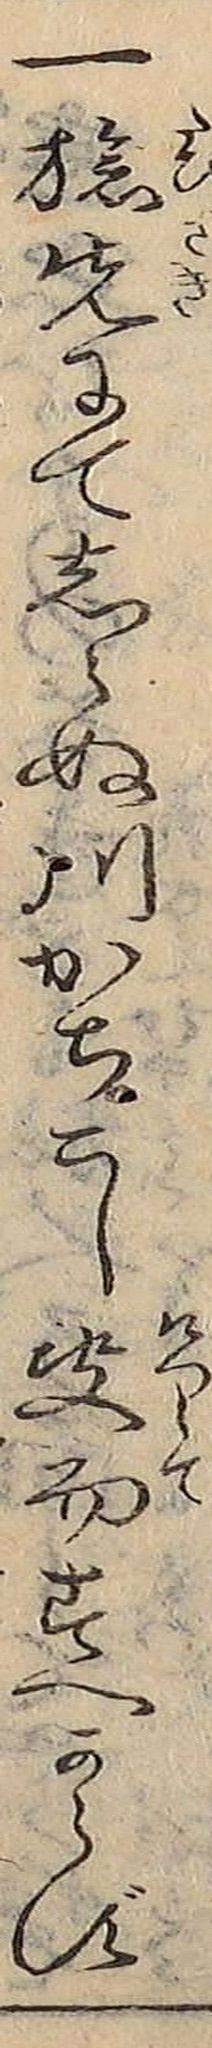一旅先にてしらぬ川かちこし決而すへからず
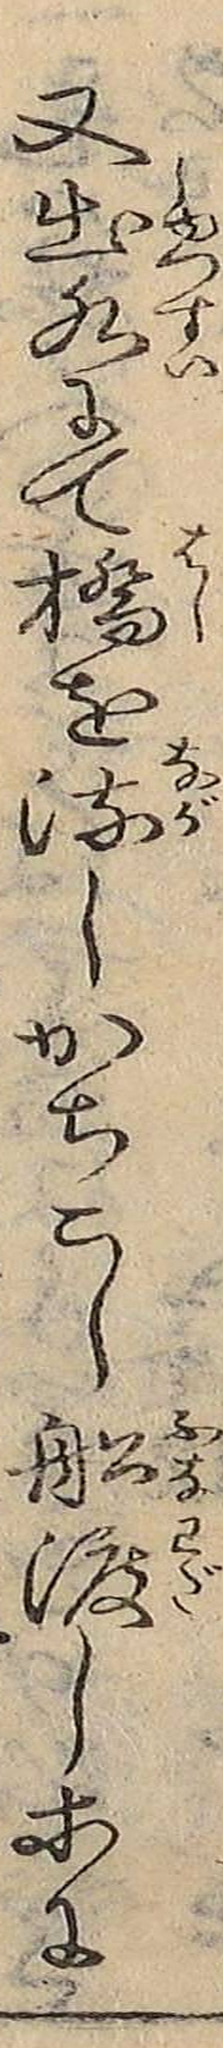又出水にて橋を流しかちこし船渡し等に
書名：旅行用心集
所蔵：神戸大学附属図書館 国文学研究資料館
